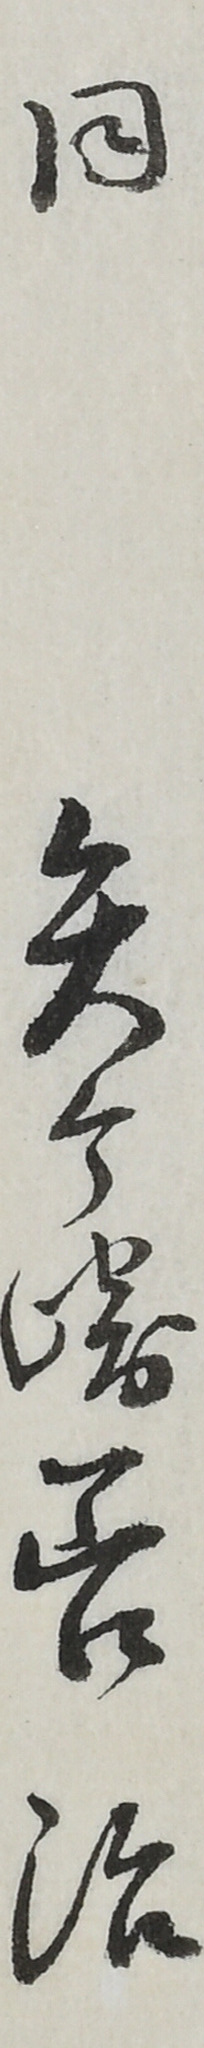同矢ヶ崎善治

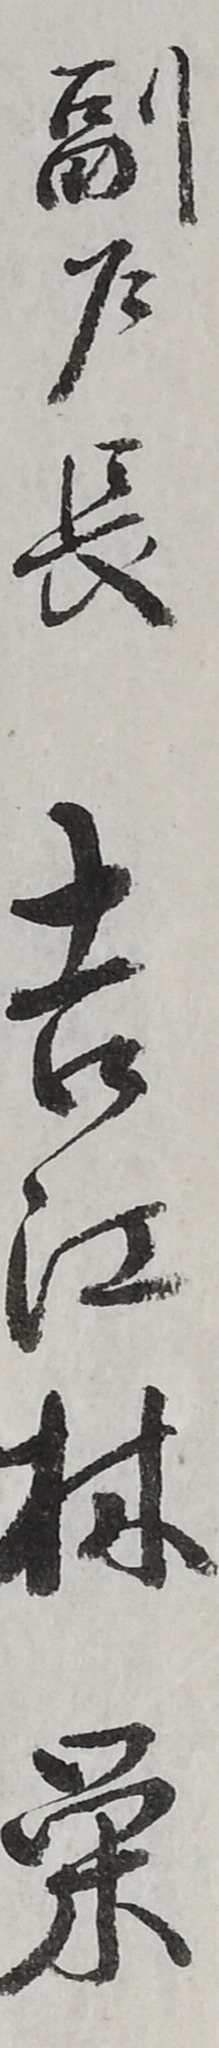副戸丁吉江林栄
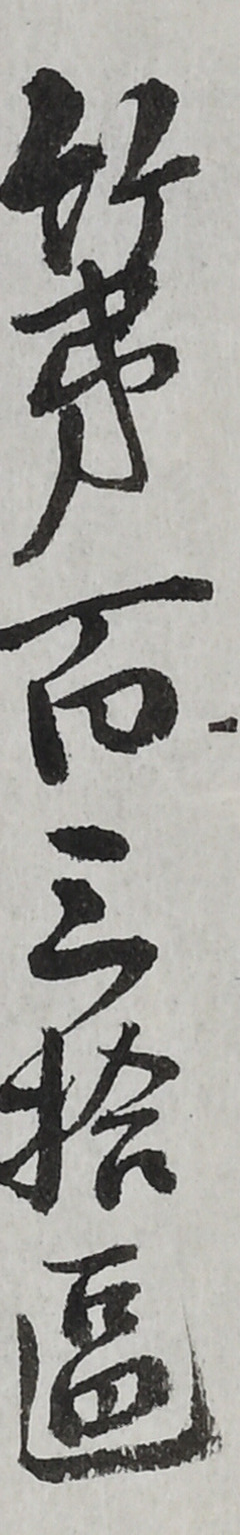第百三拾区
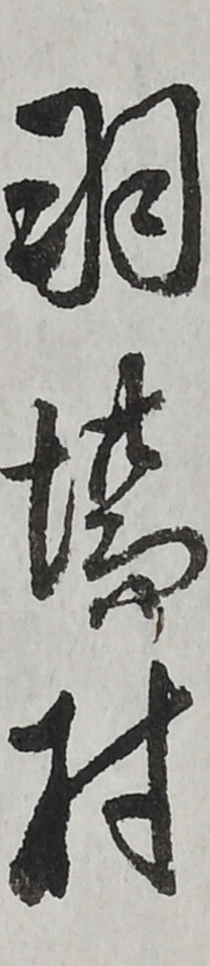羽場村
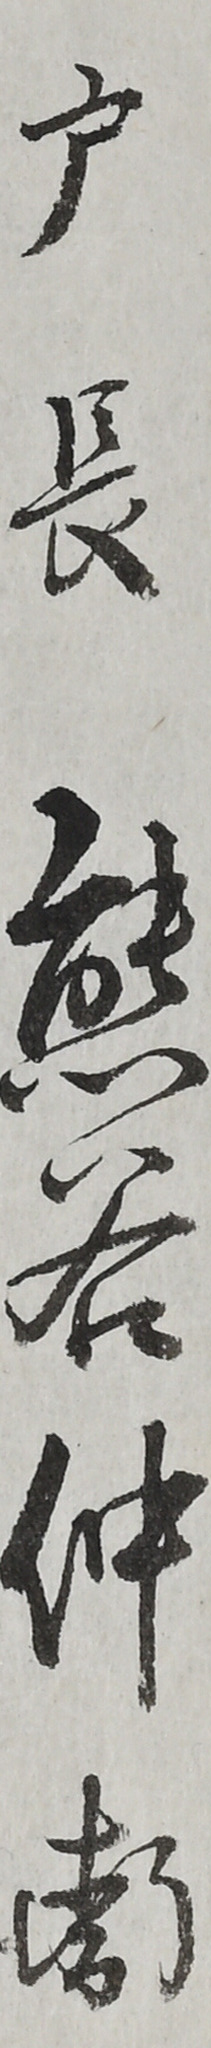戸長熊谷中衛
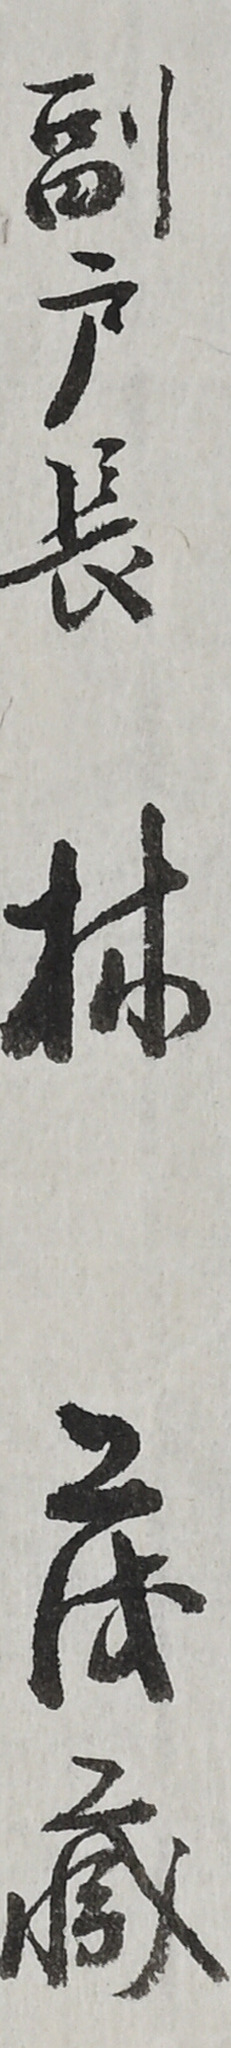副戸長林茂蔵
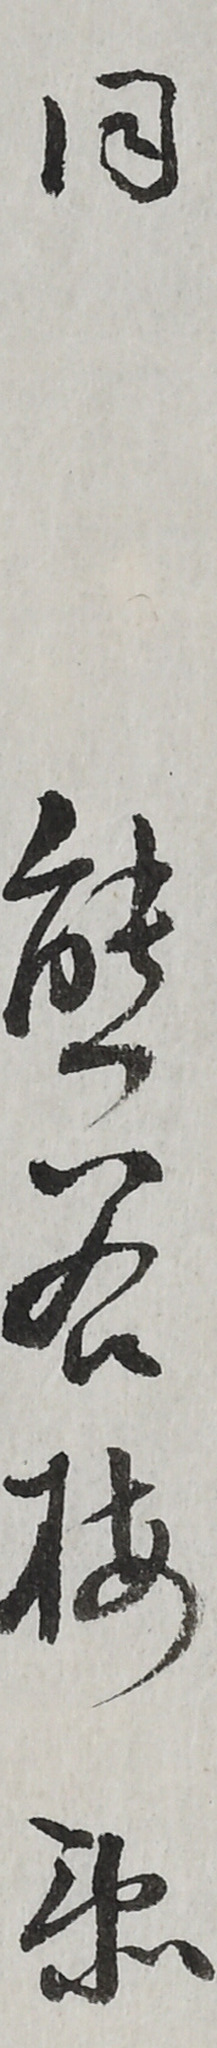同熊谷梅衛
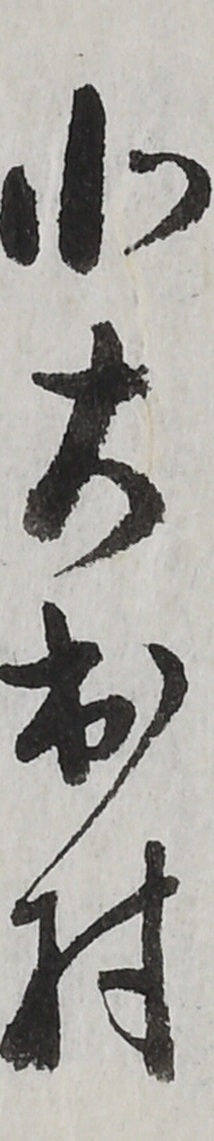北大出村
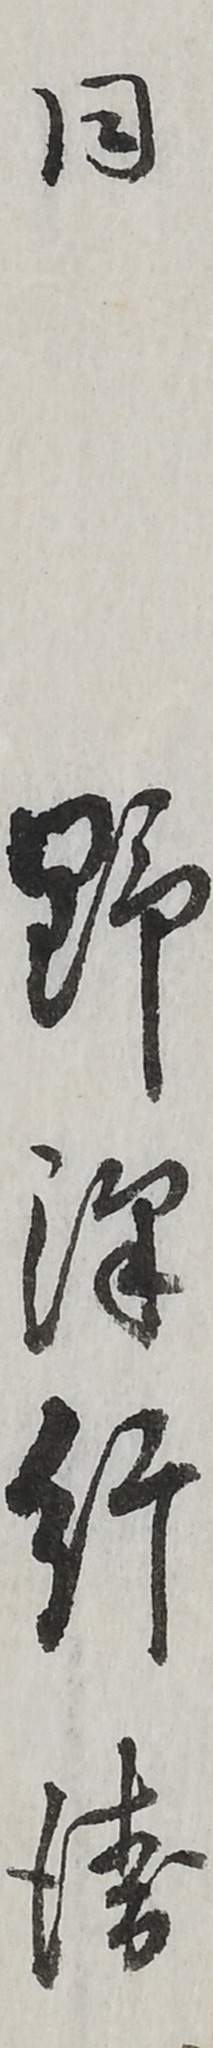同野澤行衛
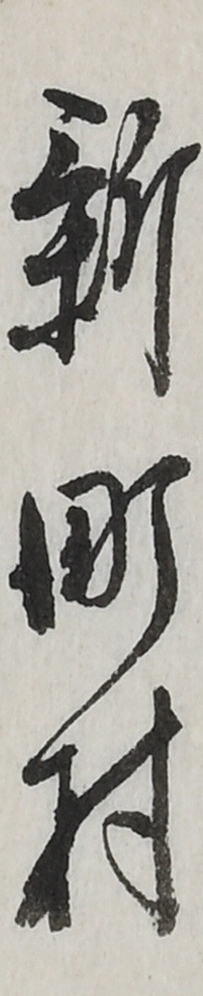新町村
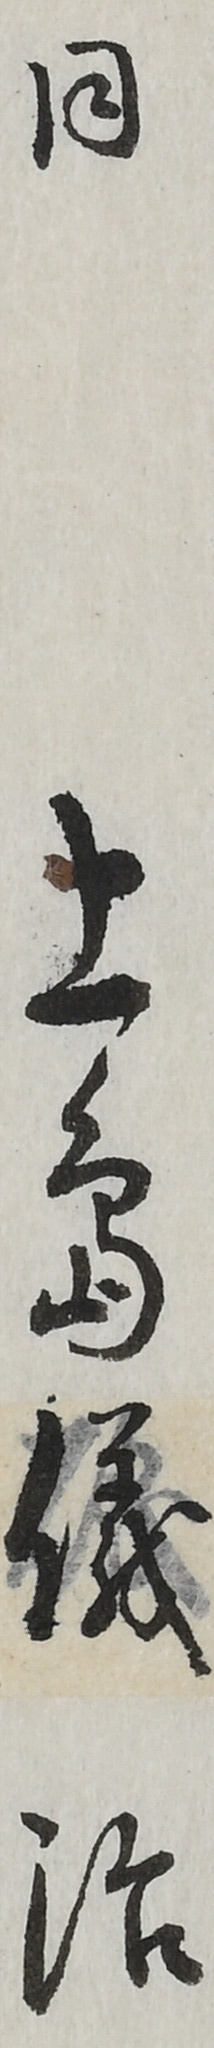同土島儀治
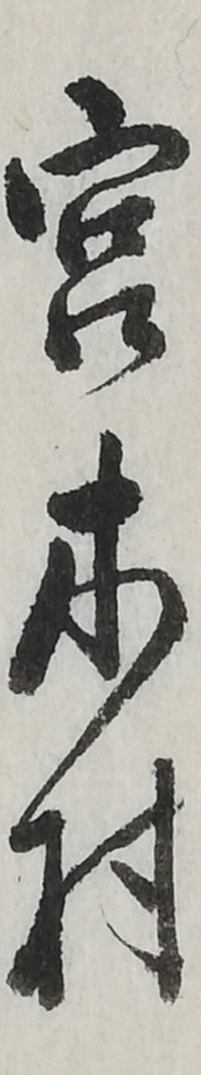宮木村

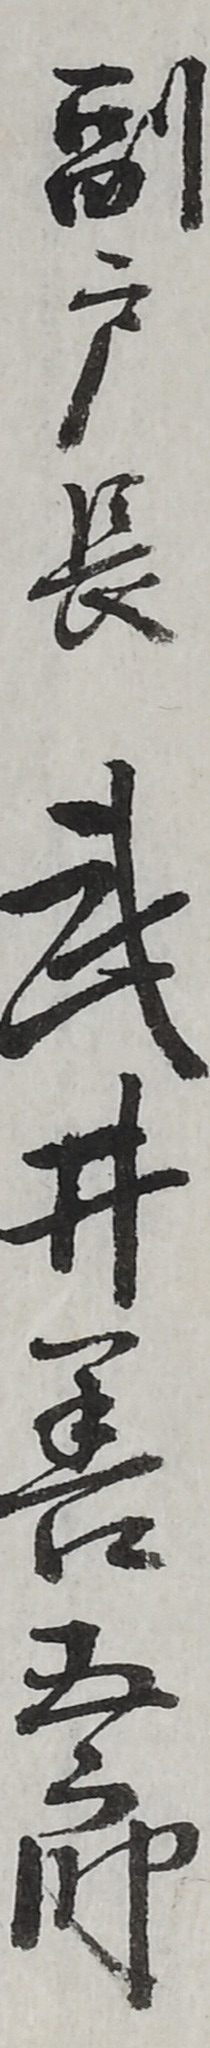副戸長武井善五郎
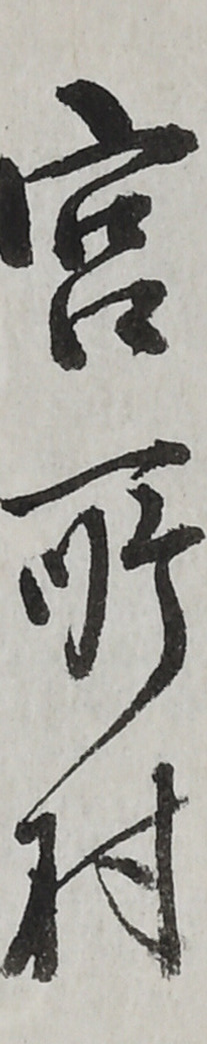宮所村
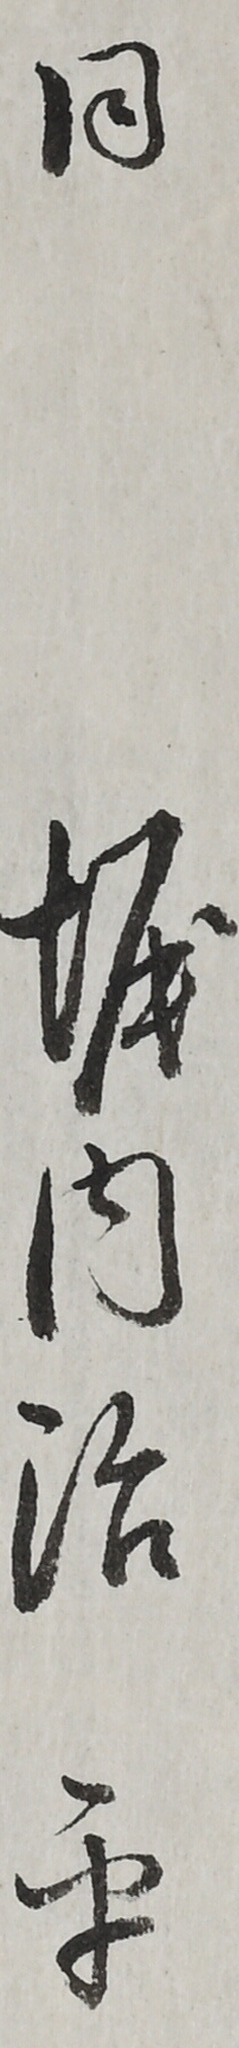同堀内治平
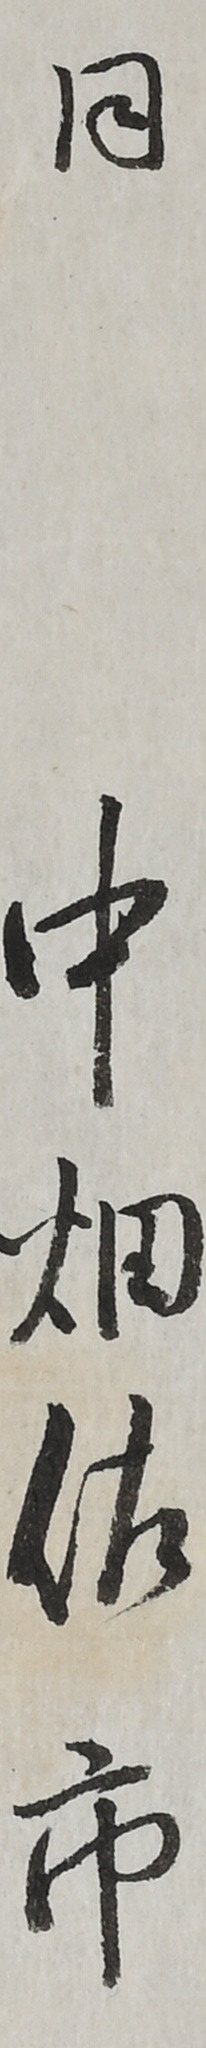同中畑佐市
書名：伊那郡毎村戸長副戸長名簿
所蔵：伊那市立高遠町図書館・合同会社AMANE
